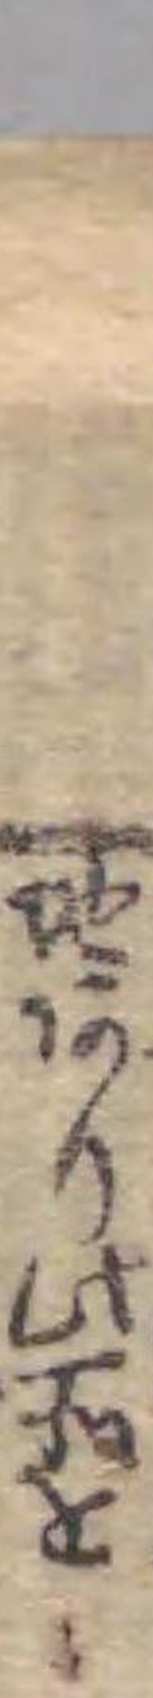地あり此所を
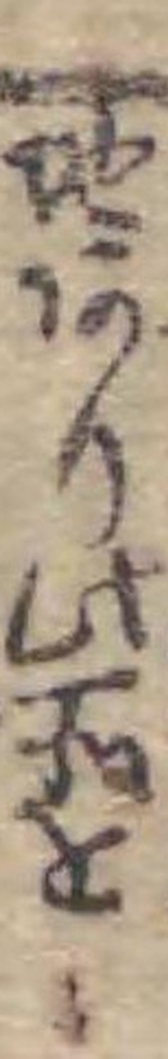地あり此所を
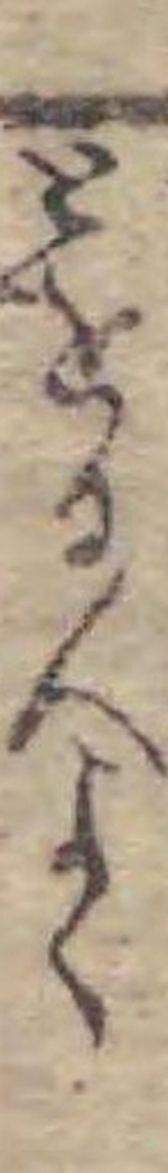とをる人よく
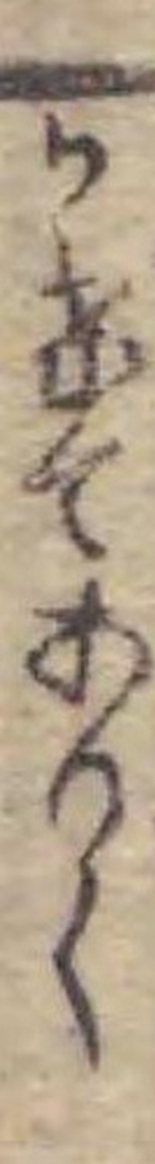かけてありく
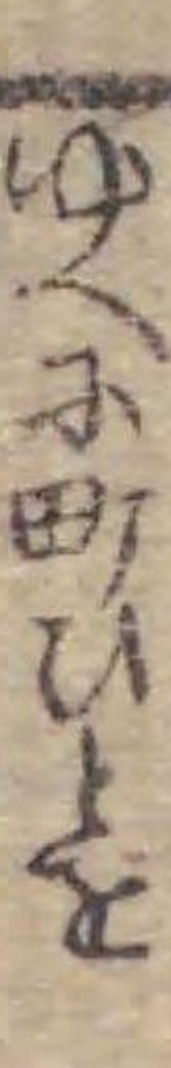ゆへに町ひとを
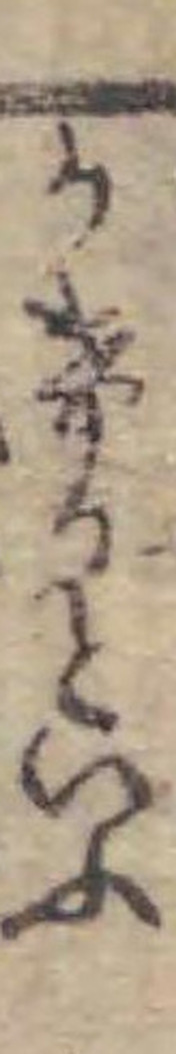かけりといふ
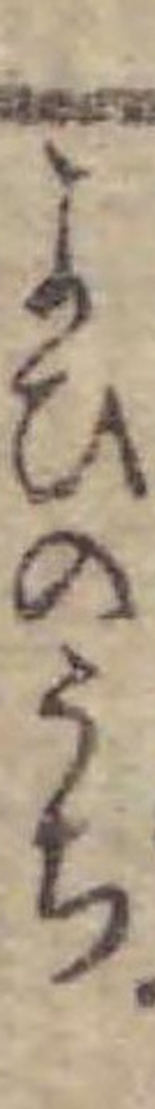よひのうち
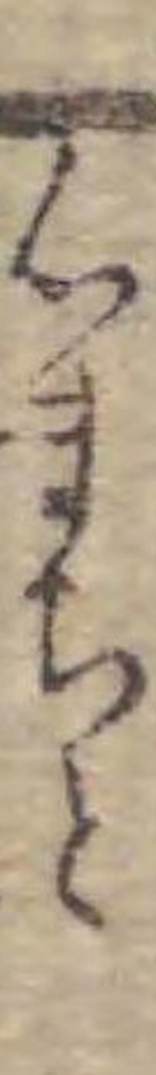心まちと
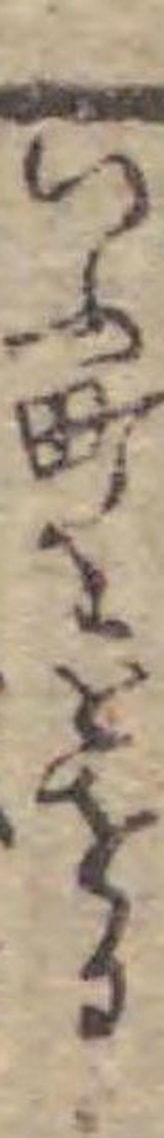いふ町をとをる
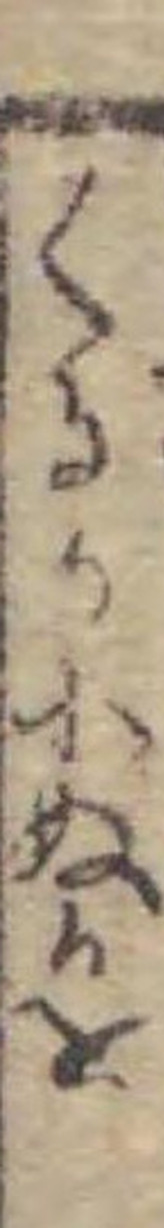くるか小ぬかを
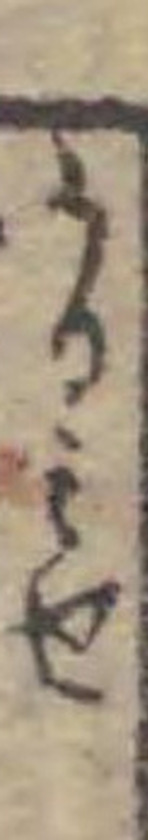うるみせ
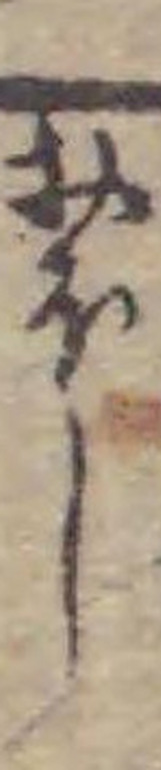おほし
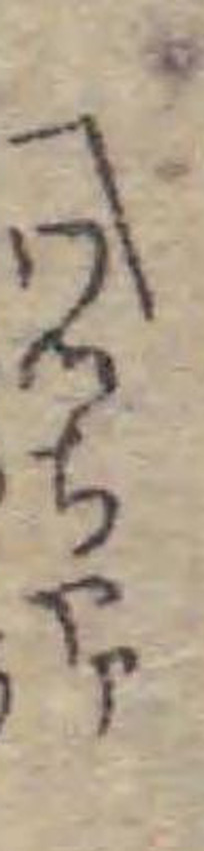〽わつちやァ
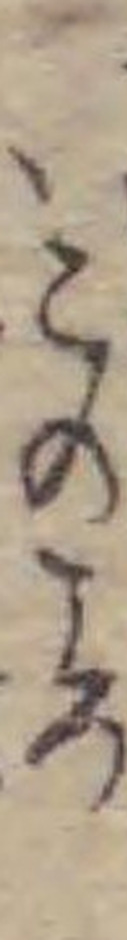このころ
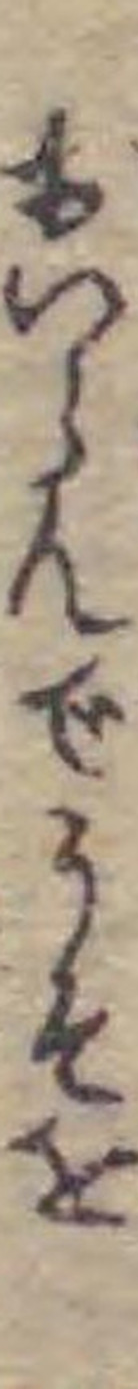おいらんでうそを
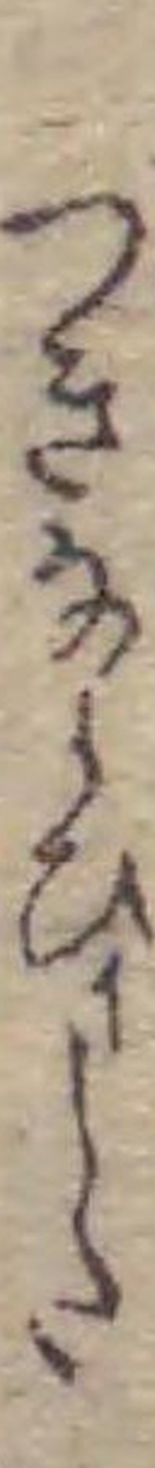つきならひィした
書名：北国順礼唄方便 : 3巻
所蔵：国立国会図書館 National Diet Library, JAPAN
